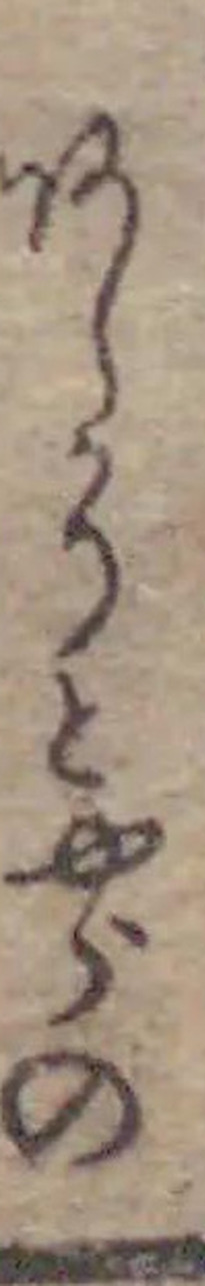何たりとやらの
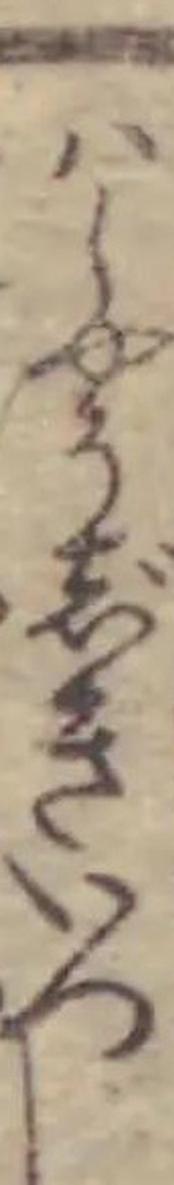はしやうじきいつ
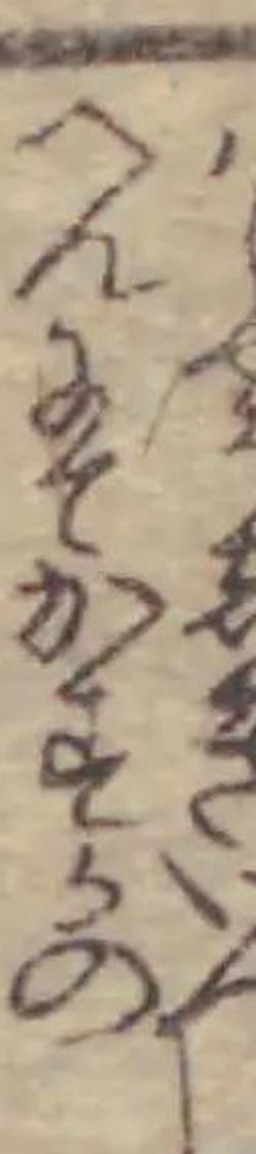へんにてかすかの
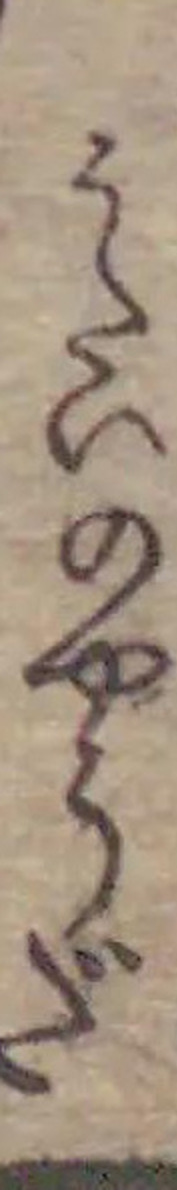うたいのやうだ
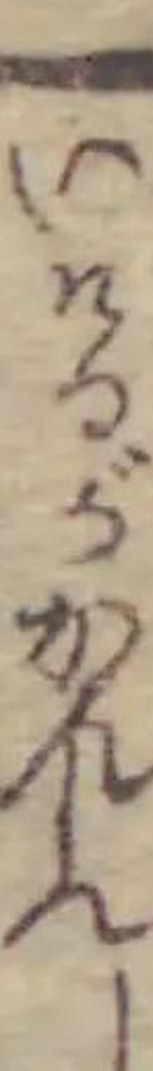いけるがかんしん
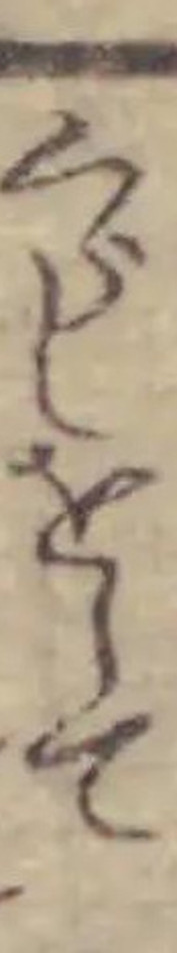くらしをして
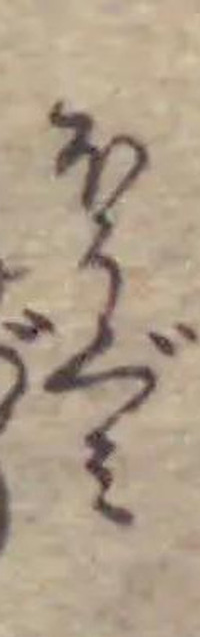ほうぐみ
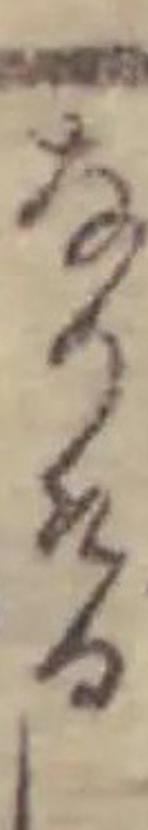なりける
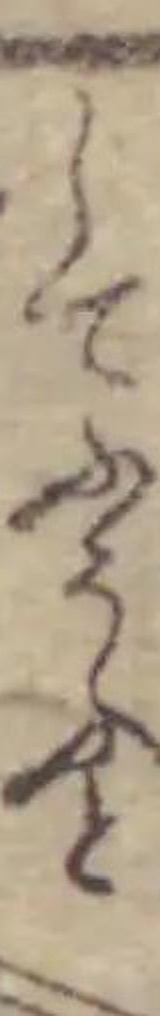してふうふと
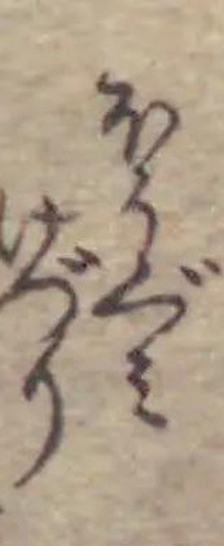けづり
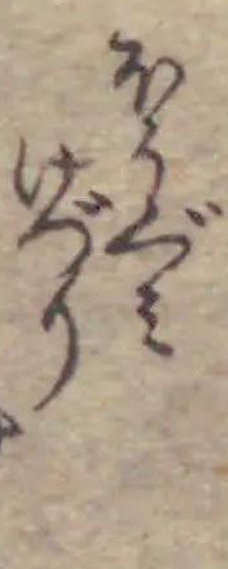けづり
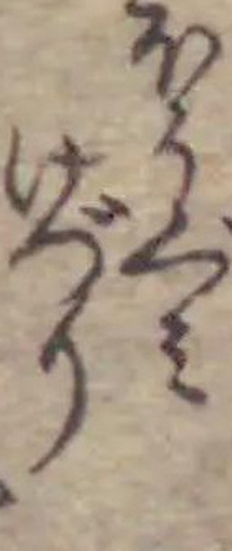けづり
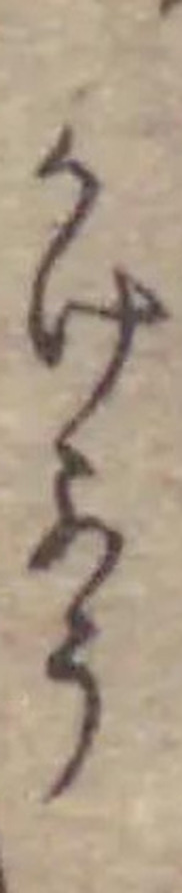かけよう
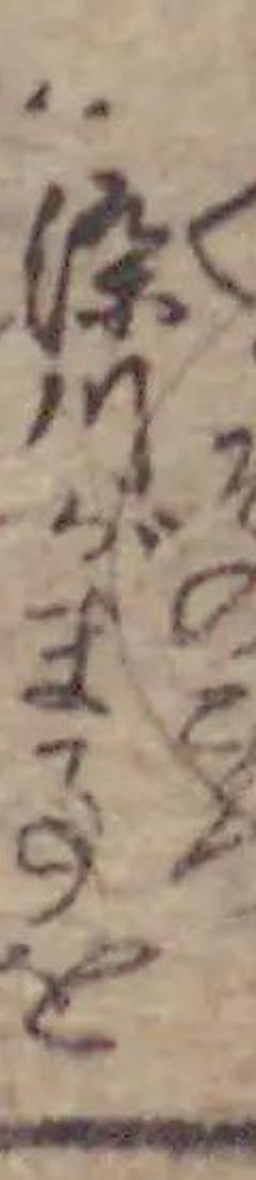染川がま事を
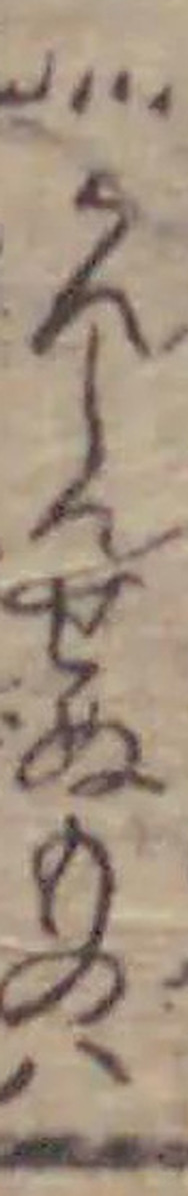かんしんせぬものは
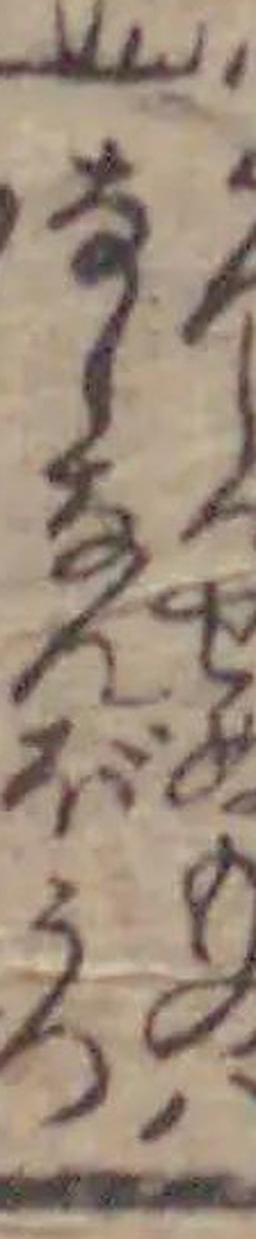なしなんぼうつ
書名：虚言弥二郎傾城誠 3巻
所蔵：国立国会図書館 National Diet Library, JAPAN
